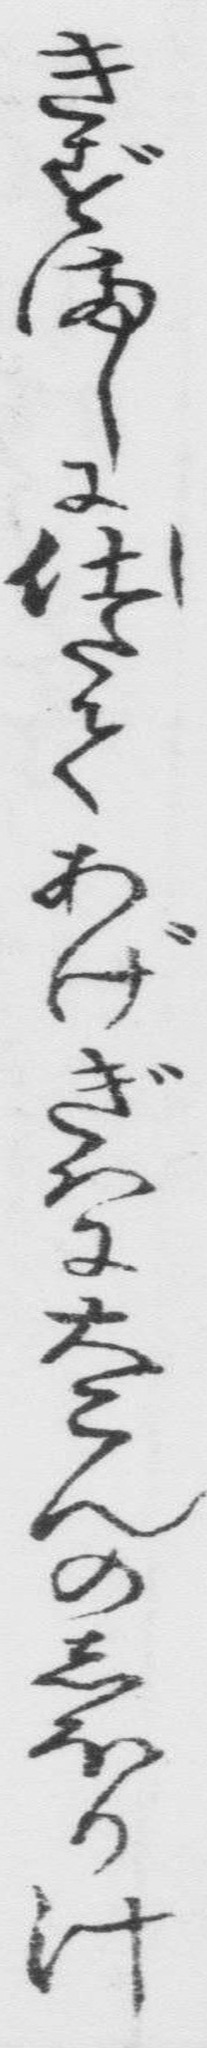きずましに仕たてあげぎはに大こんのしほり汁
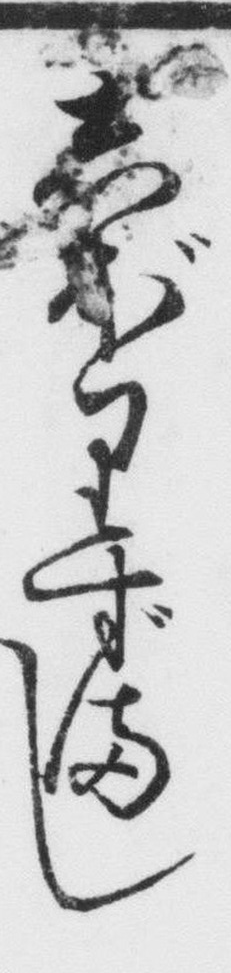しぼりずまし
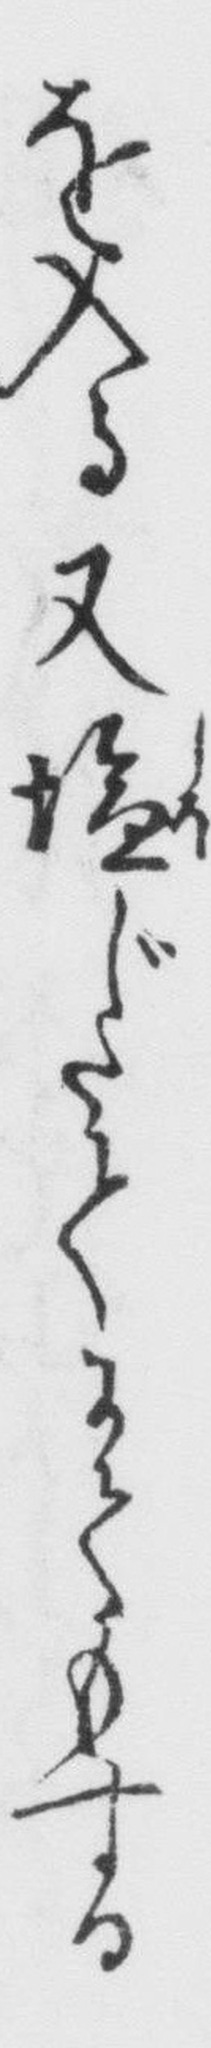を入る塩じたてにてもする
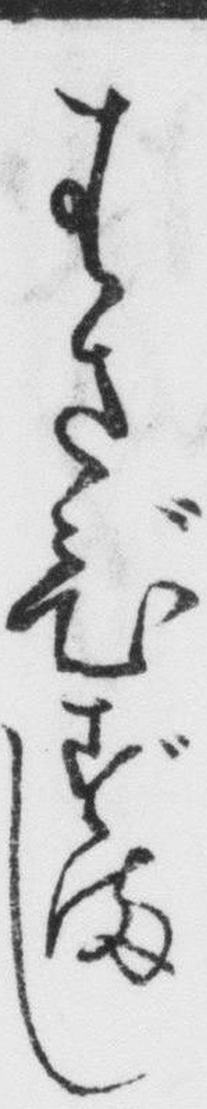わさびずまし
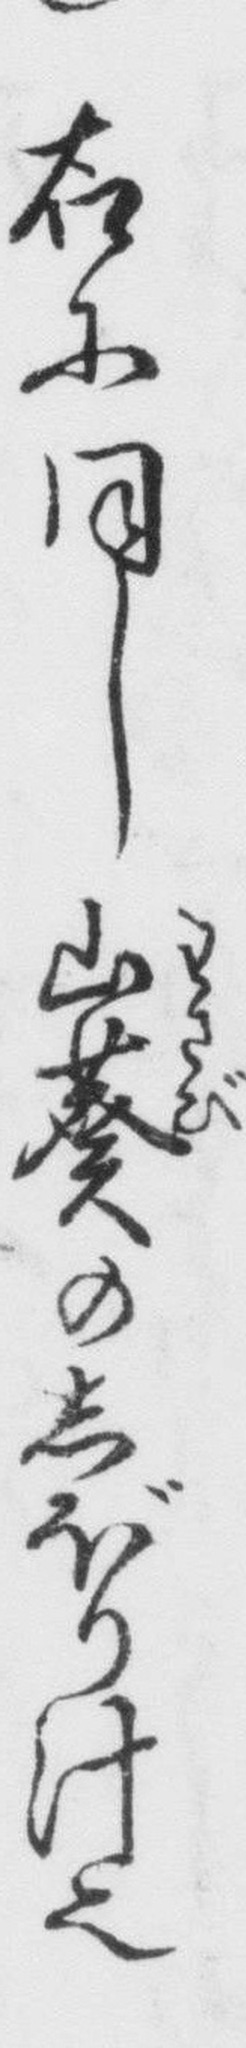右に同し山葵のしぼり汁也
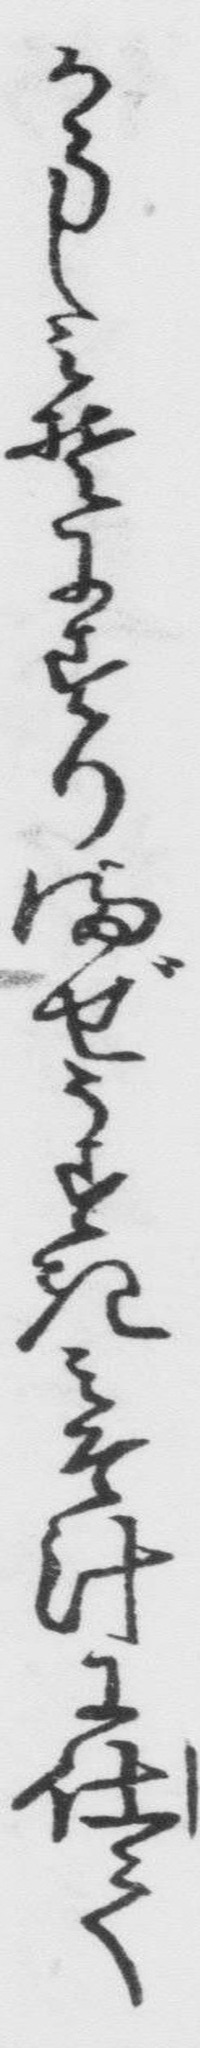からしみそにすりまぜうすきみそ汁に仕て
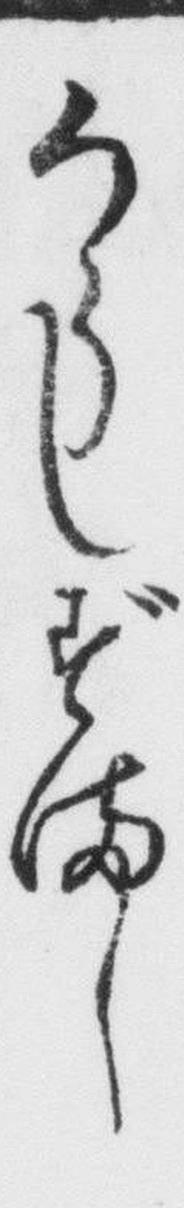からしずまし
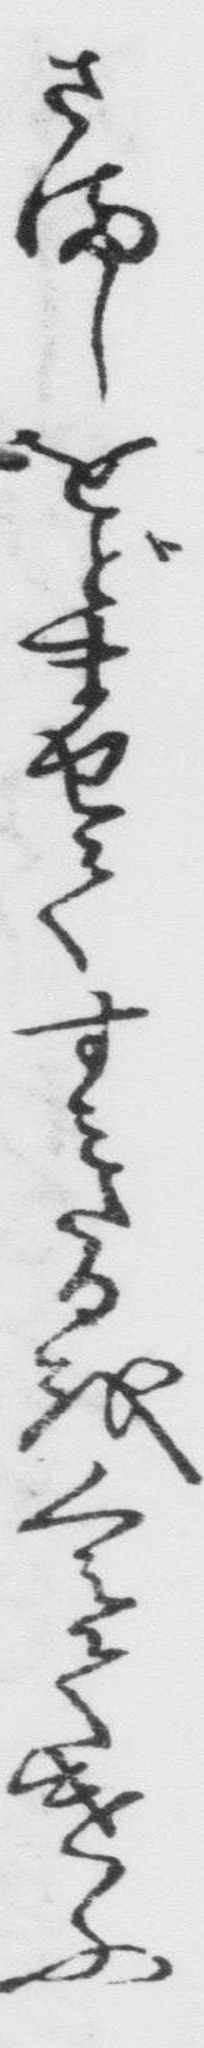さましをどませてすみたるをくみて遣ふ
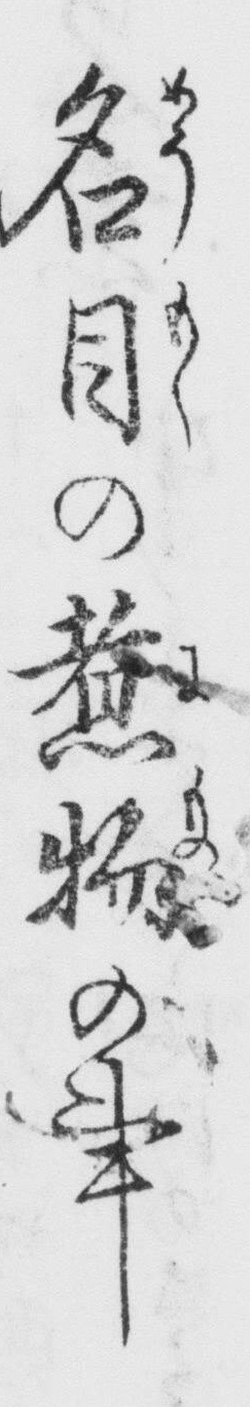名目の煮物の事
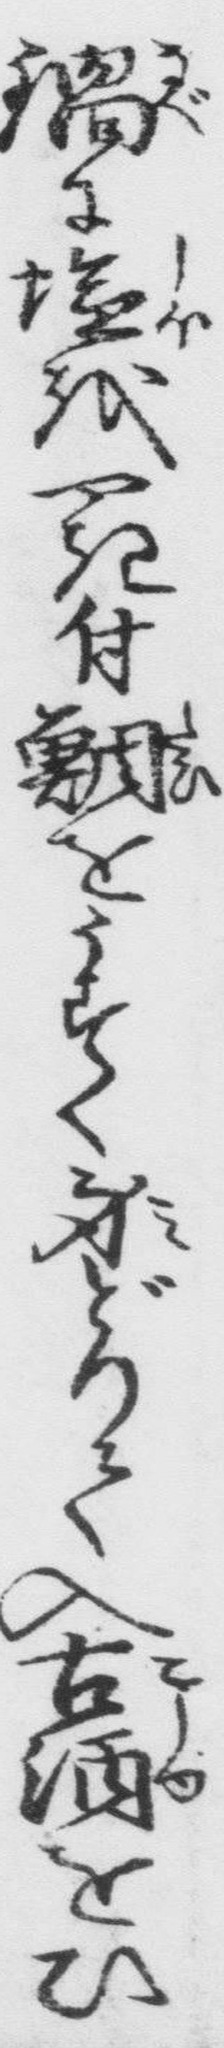鍋に塩をやき付鯛をうすく身どりて入古酒をひ
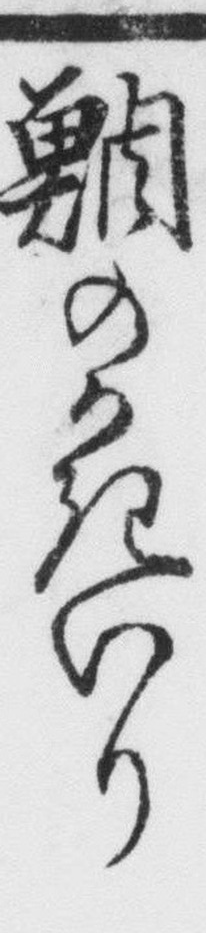鯛のかきいり
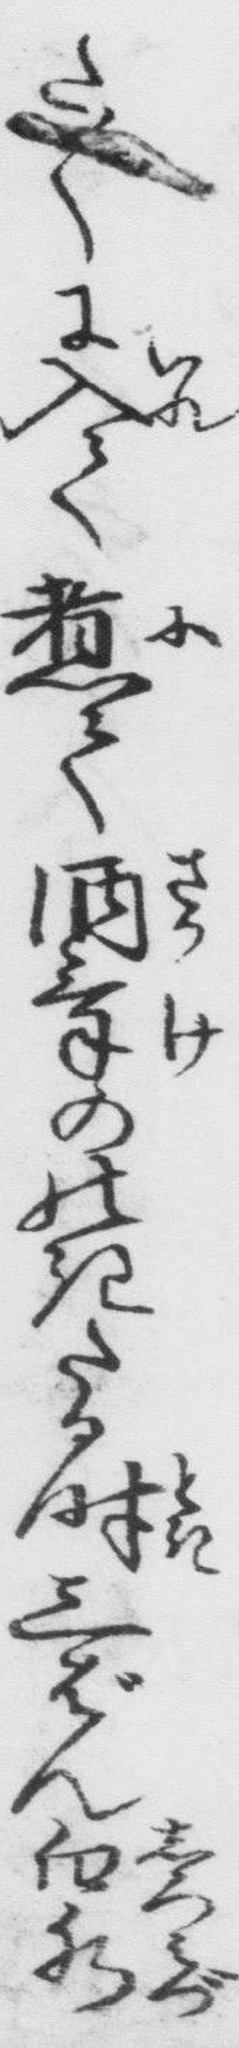た〳〵に入て煮て酒気のきたる時三ばん白水
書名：料理早指南
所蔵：大阪府立大学学術情報センター 国文学研究資料館
